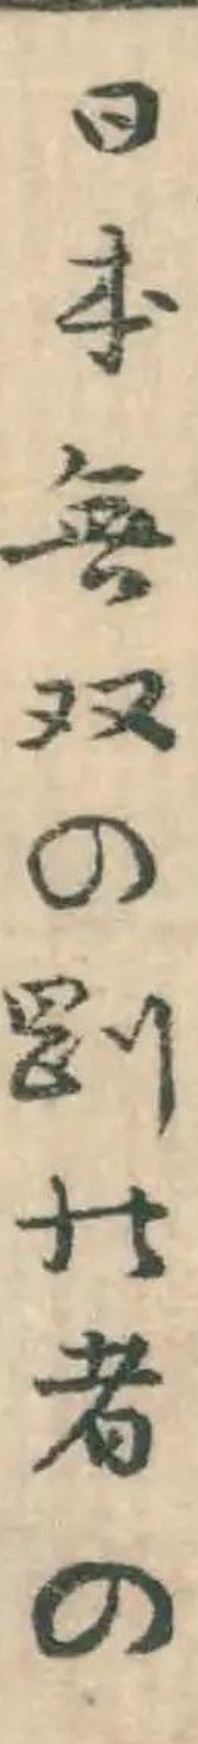日本無双の剛の者の
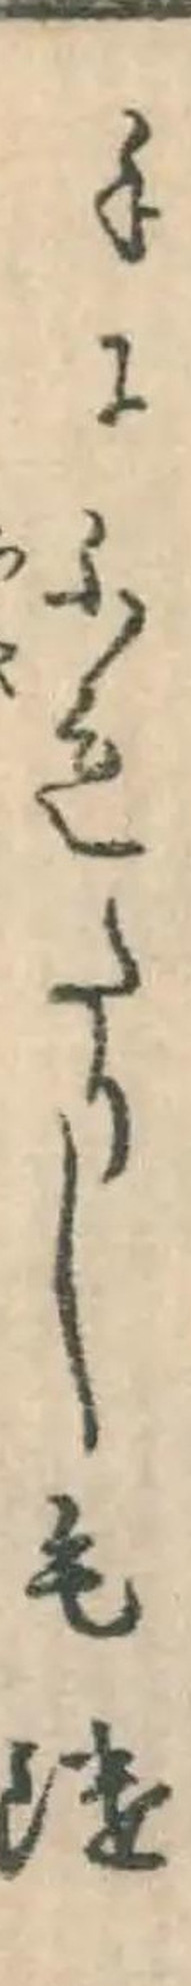手にふれたりし毛鑓
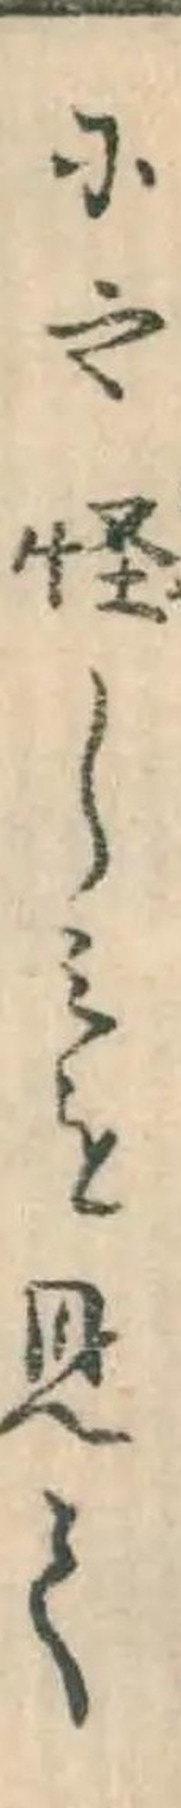にや怪しみを見て
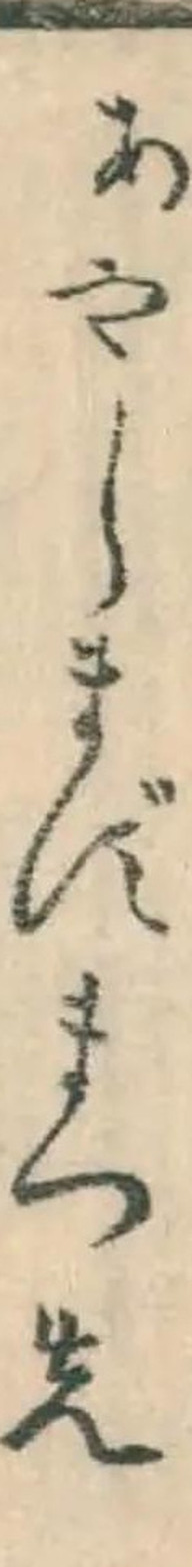あやしまずまつ先
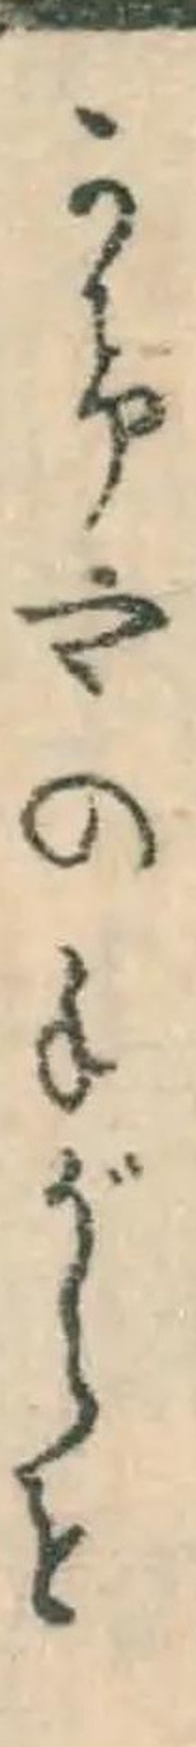かけやのてがらを
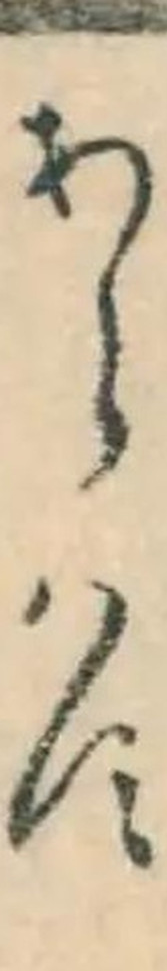あらはす
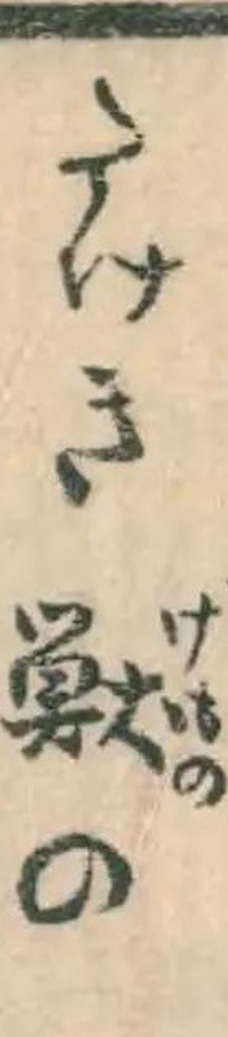たけき獣の
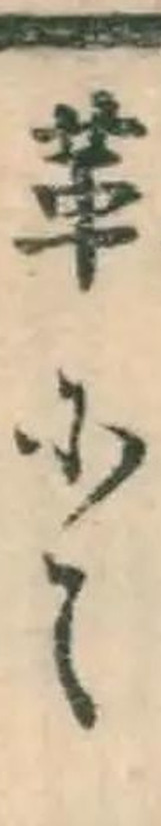革にて
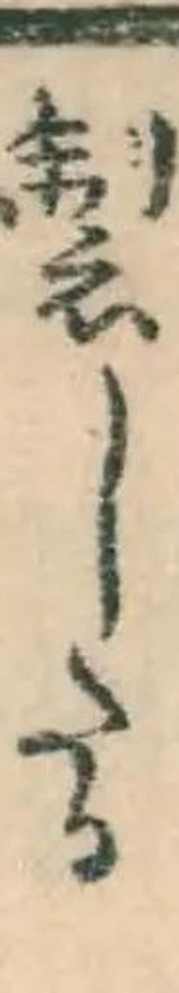製したる
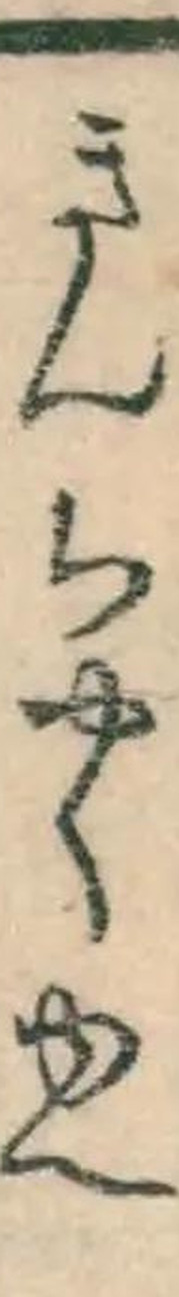きんちやくゆへ
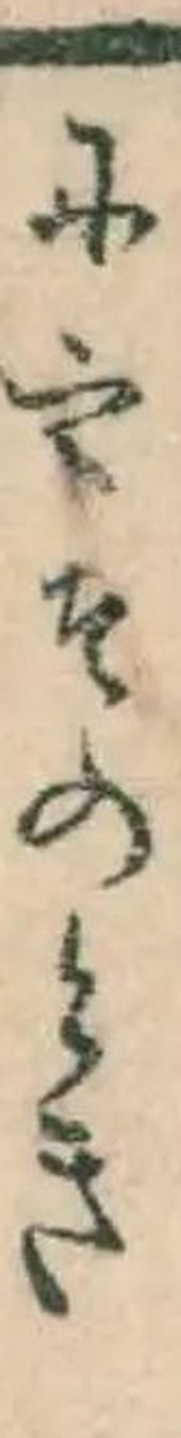にやそのとき
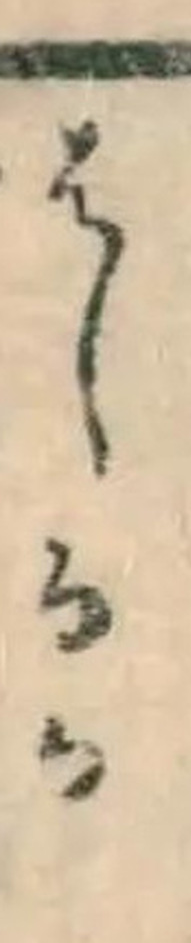はしるか
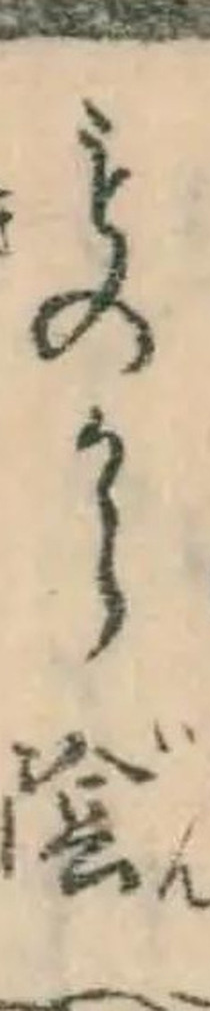ものから陰
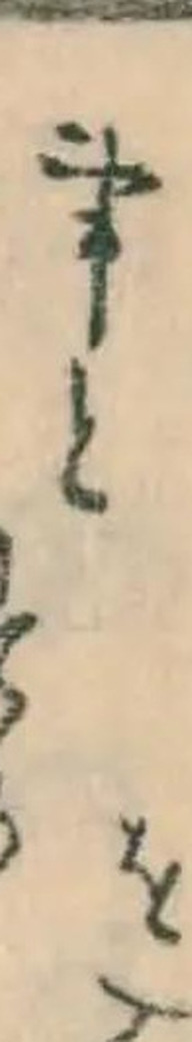事とする
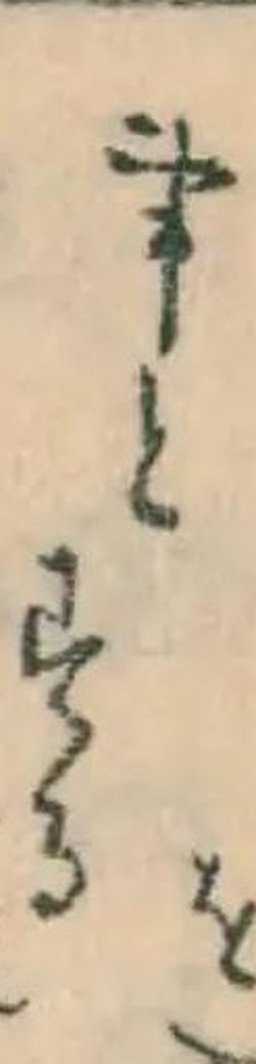事とする
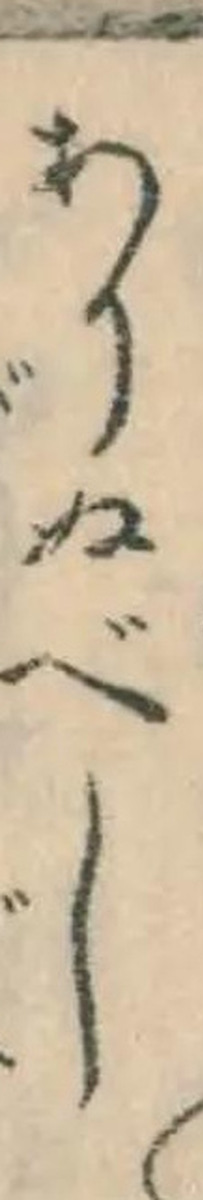ありぬべし
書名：百鬼徒然袋 3巻. [2]
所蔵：国立国会図書館 National Diet Library, JAPAN
